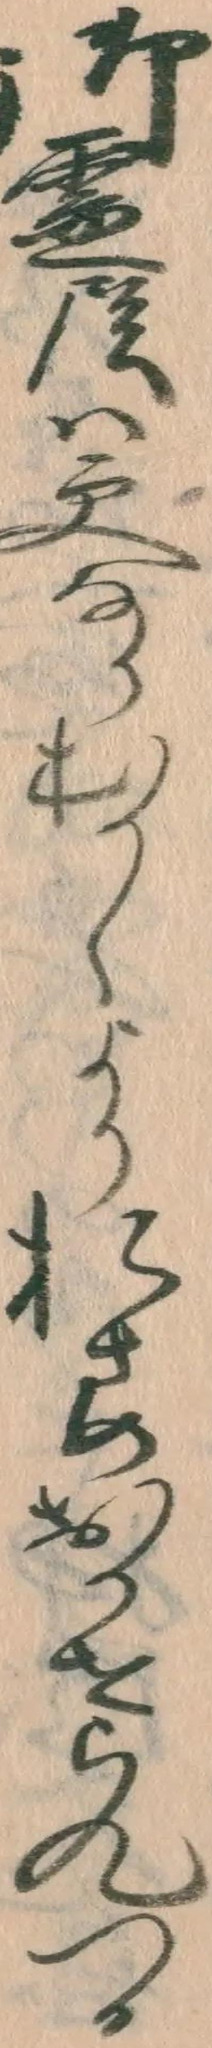御霊屋ハ更なりむかしよりおさめおかせられつる
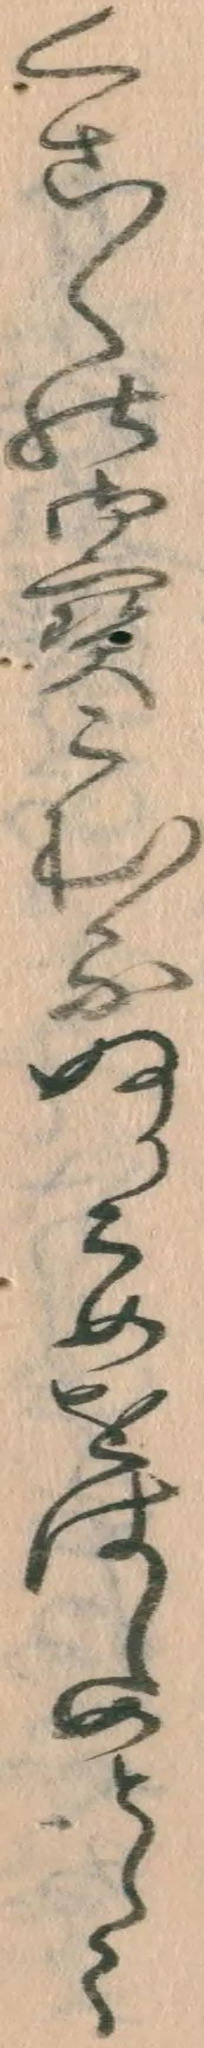くさ〳〵の御寶こむるぬりこめをはしめとして
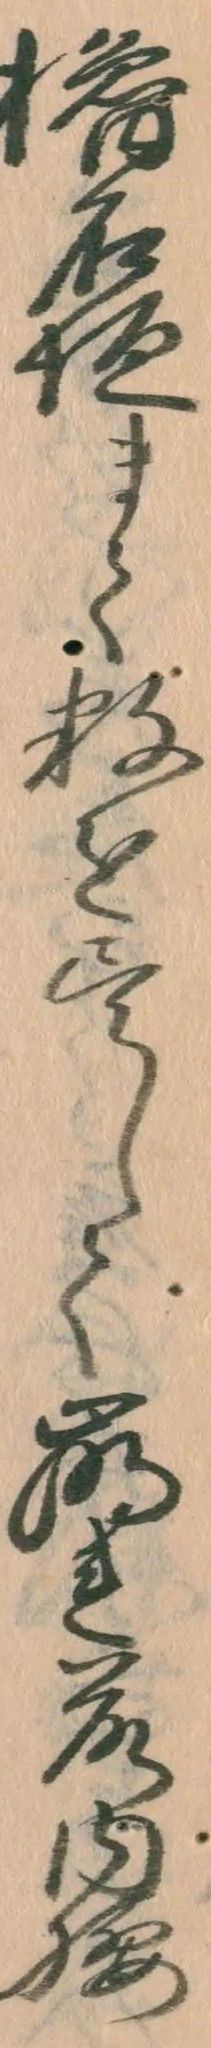櫓石垣まて数を尽して崩れ落内腰
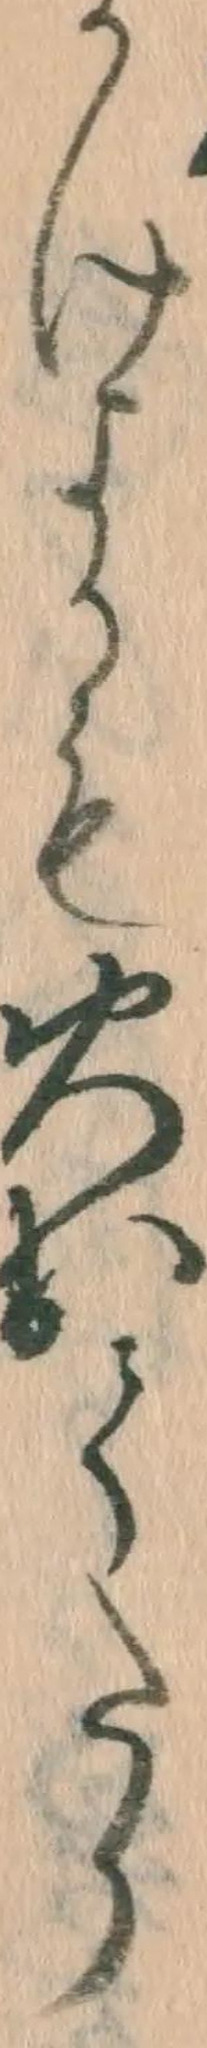かけよりも火出てたり
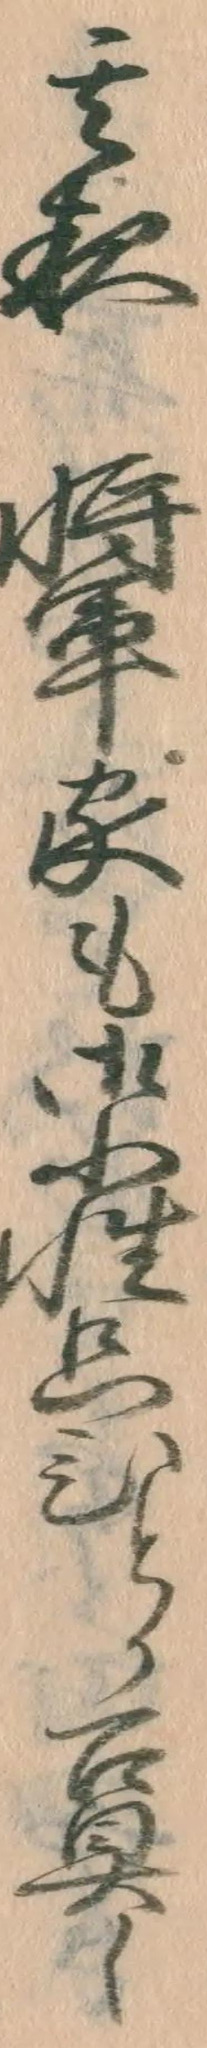其夜将軍家も御小性只ひとり召具し
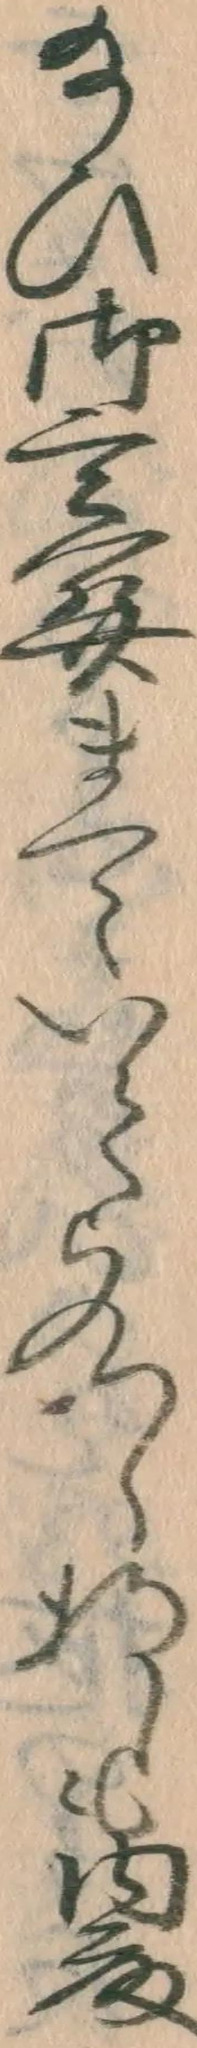玉ひ御玄関まていてられし折しも内藤
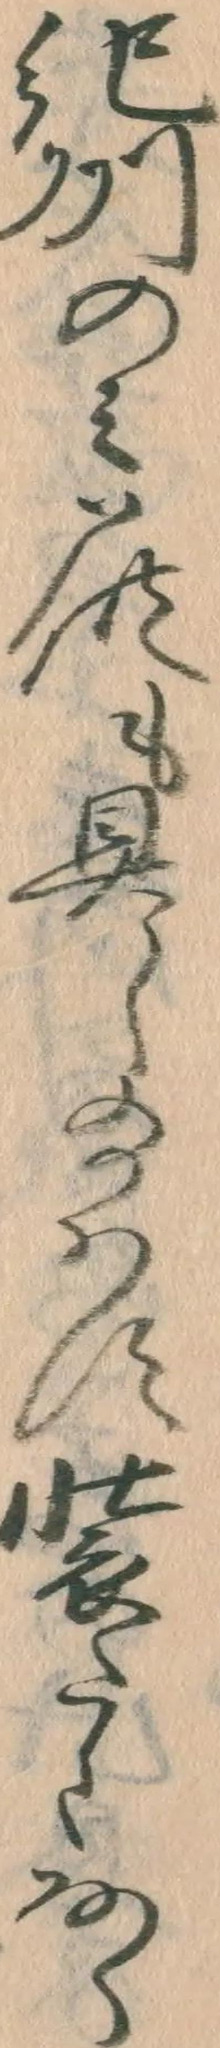紀州のミ御供も具し玉ハす装たになく
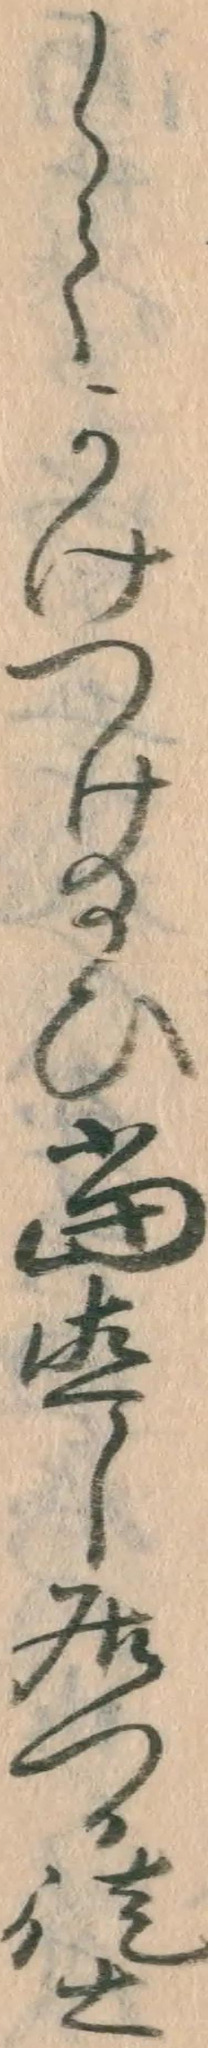してかけつけ玉ひ當直し居つる徒士
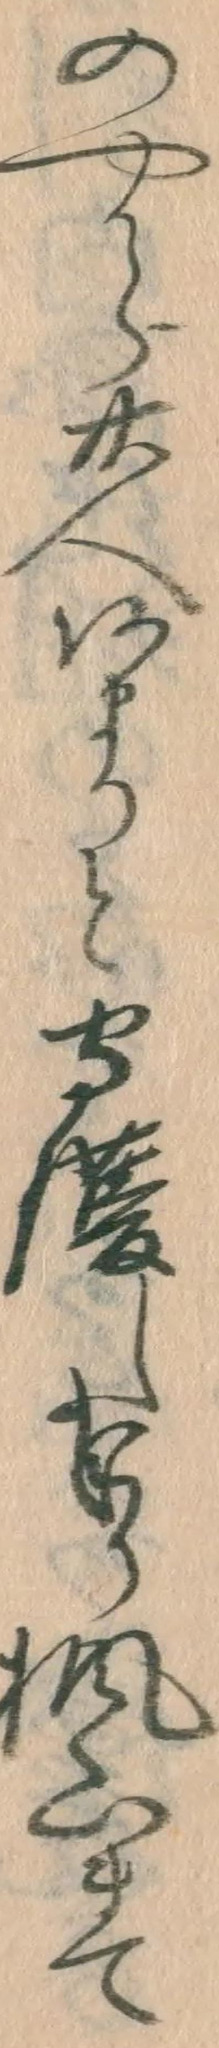のやから廿人あまりと守護し奉り楓山まて
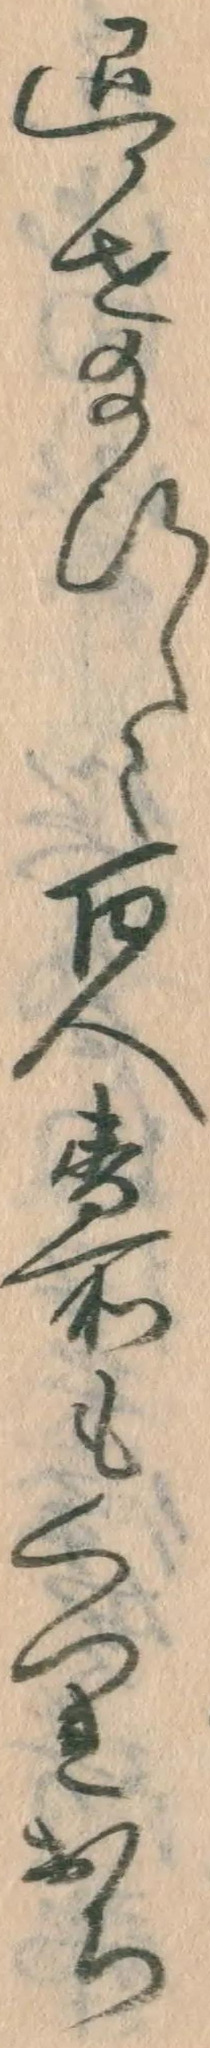退せ玉ひしに百人番所もくつれおち
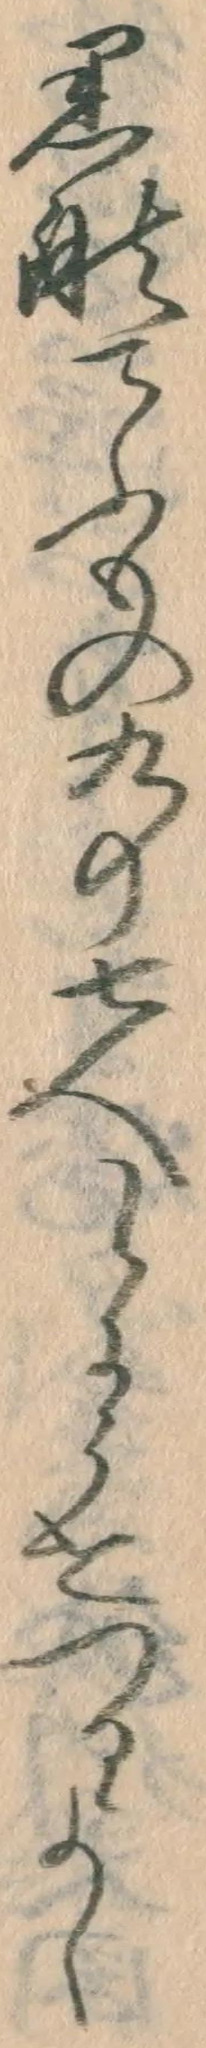黒鍬てふもの九十七人しにうせつるよし
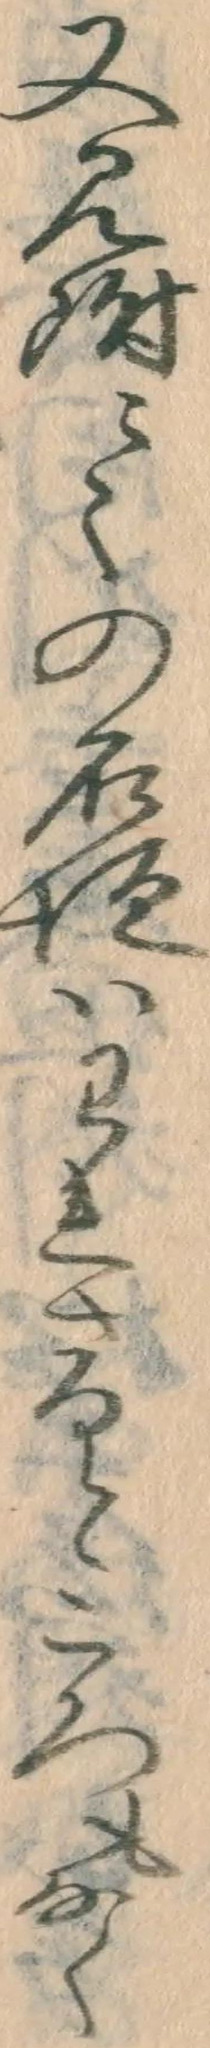又見附ニての石垣ハわれさるところもなく
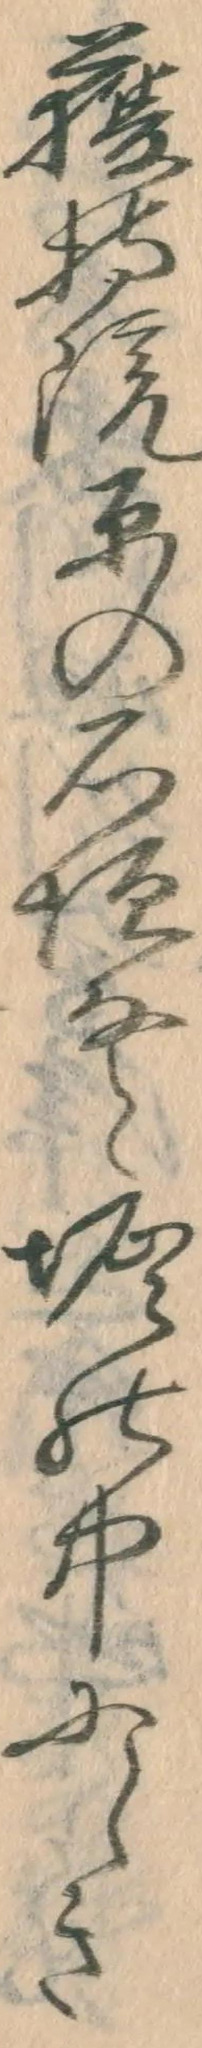護持院原の石垣なと堀の中にしき
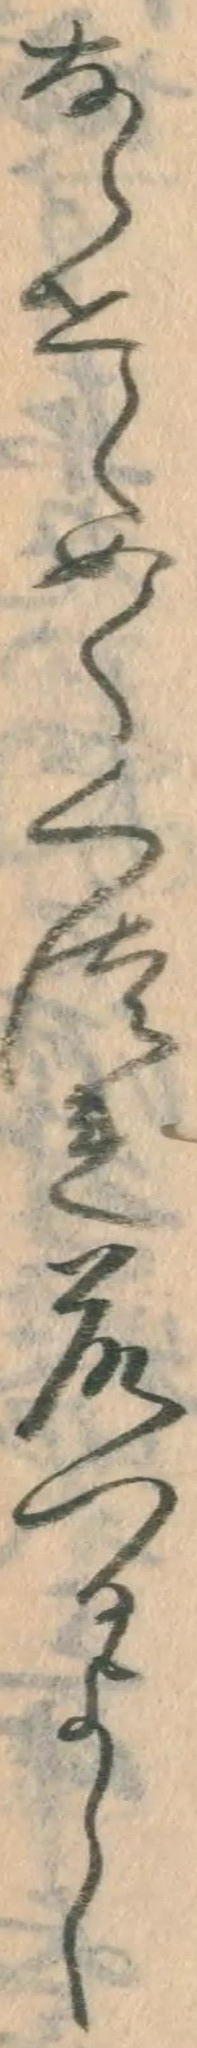ならせしめてくつれ落つるよし

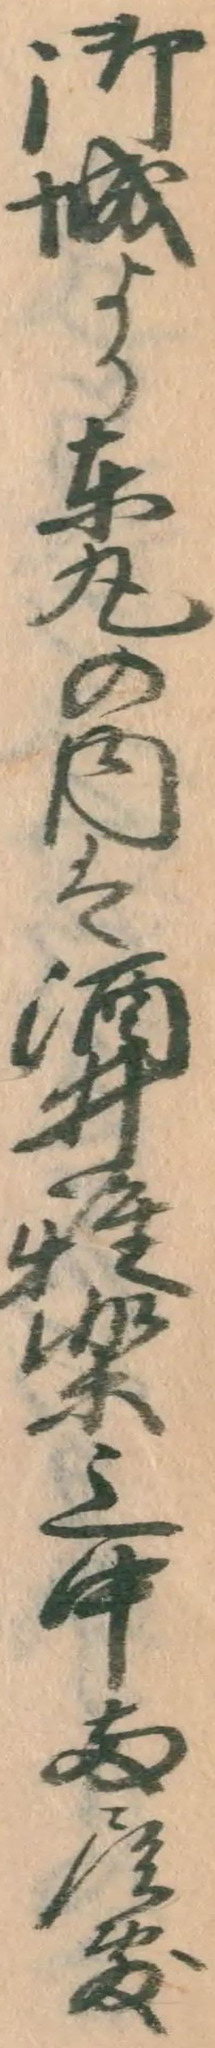御城より東丸の内は酒井雅楽上中両屋敷
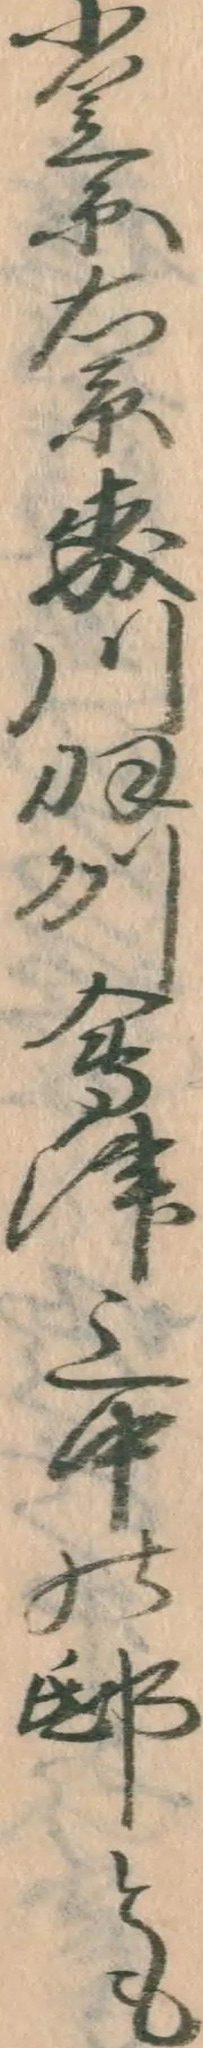小笠原右京森川羽州會津上中の邸とも
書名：麗斎叢書. 20
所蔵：国立国会図書館 National Diet Library, JAPAN
